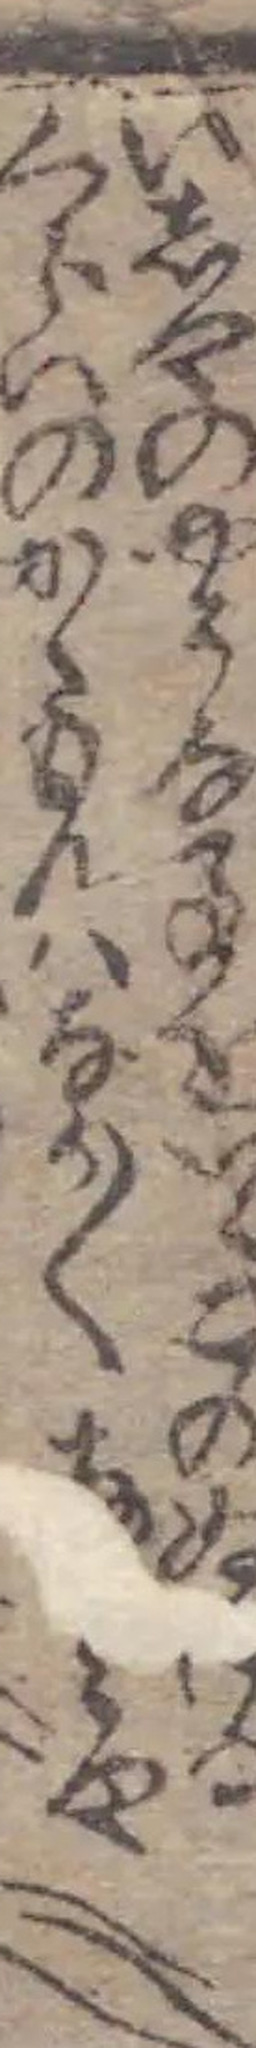くらいのかゝもんはなか〳〵なみや
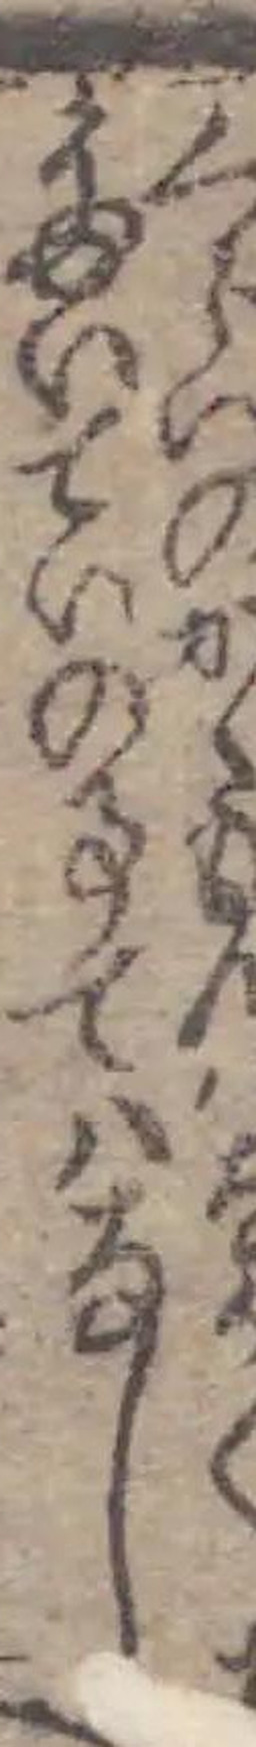はたいていの事てはなし

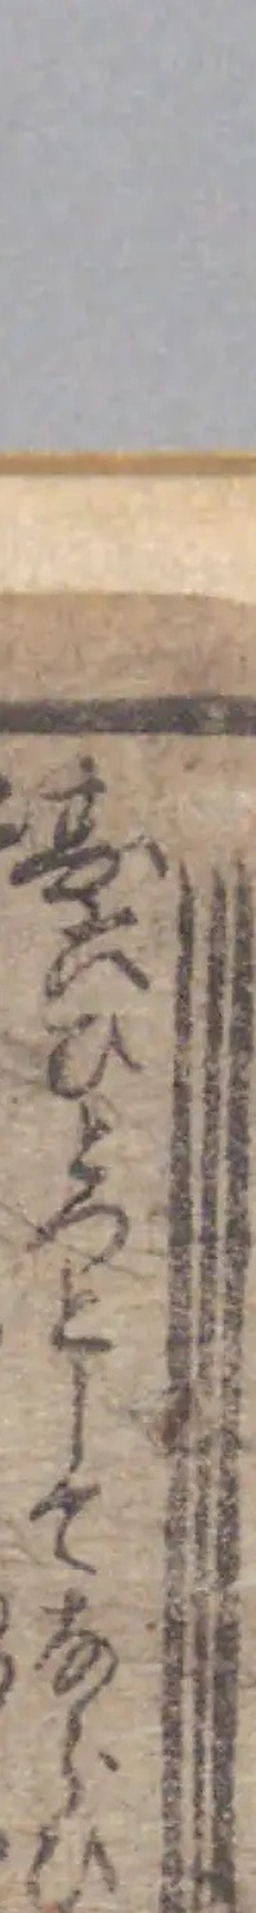甚六ひとつとしてならひ
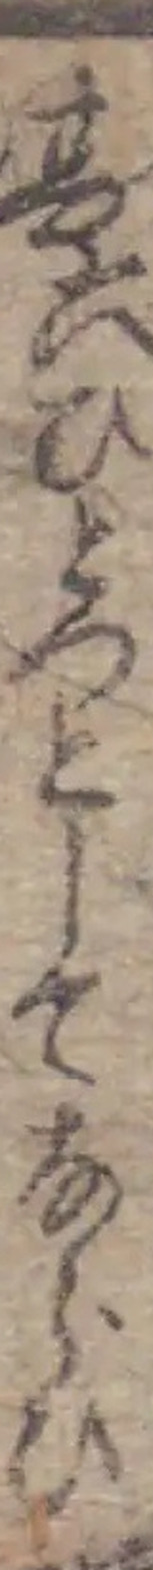甚六ひとつとしてならひ
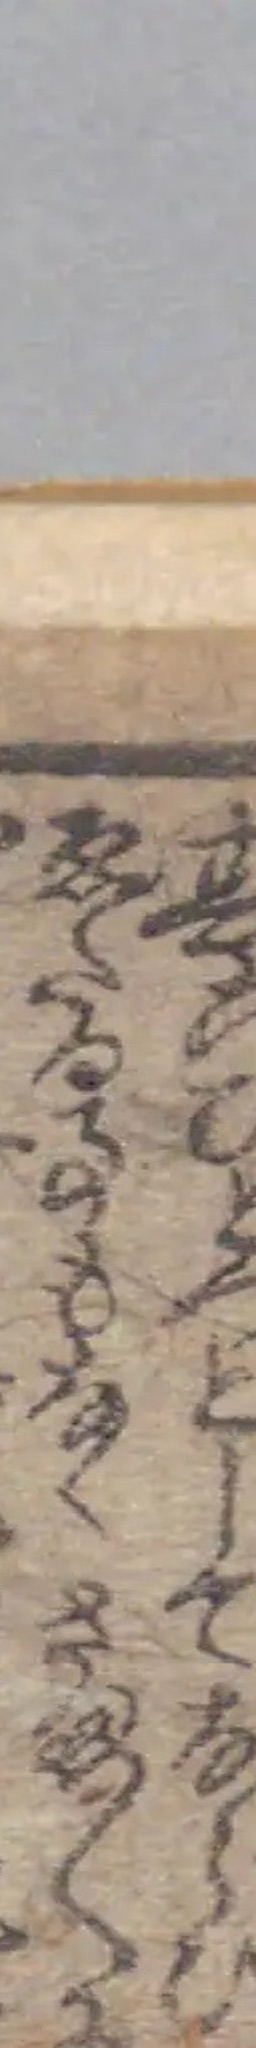ゑたる事もなくさま〳〵に
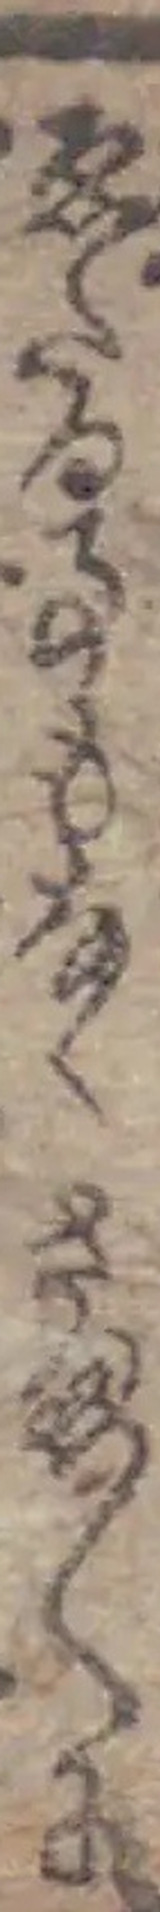ゑたる事もなくさま〳〵に
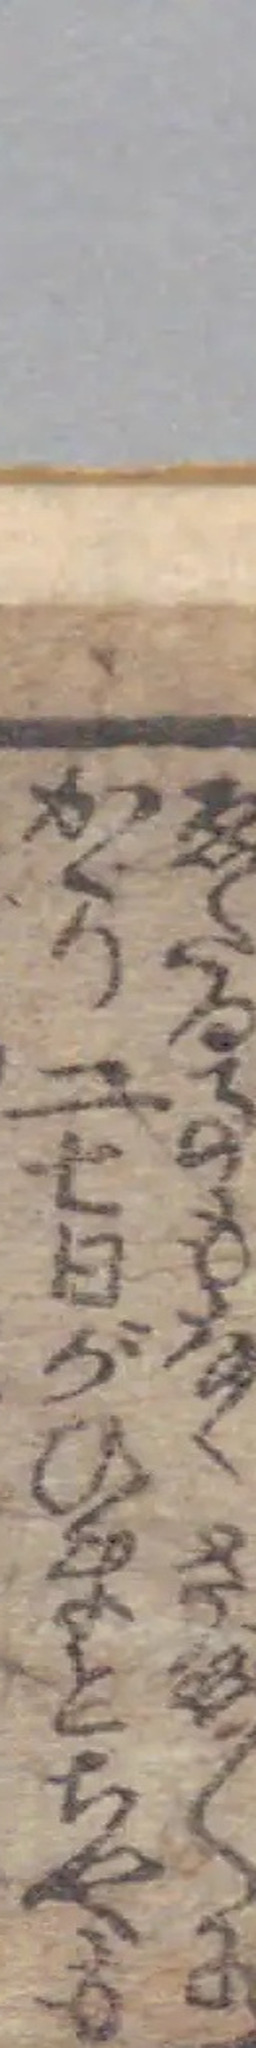かゝり二七日がひまとちやも
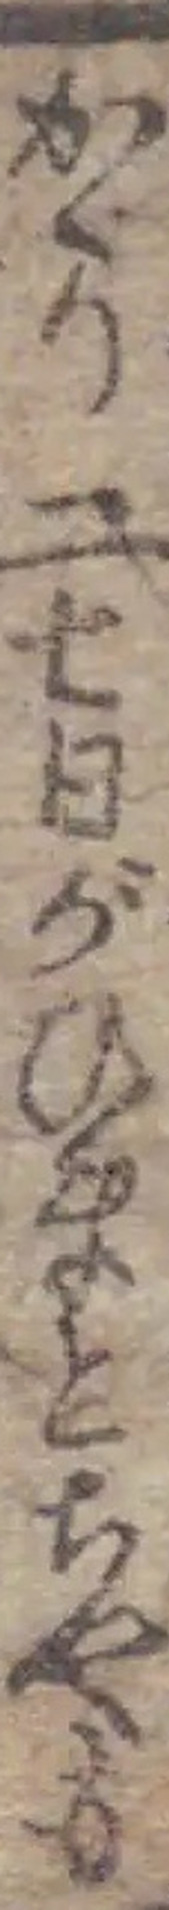かゝり二七日がひまとちやも
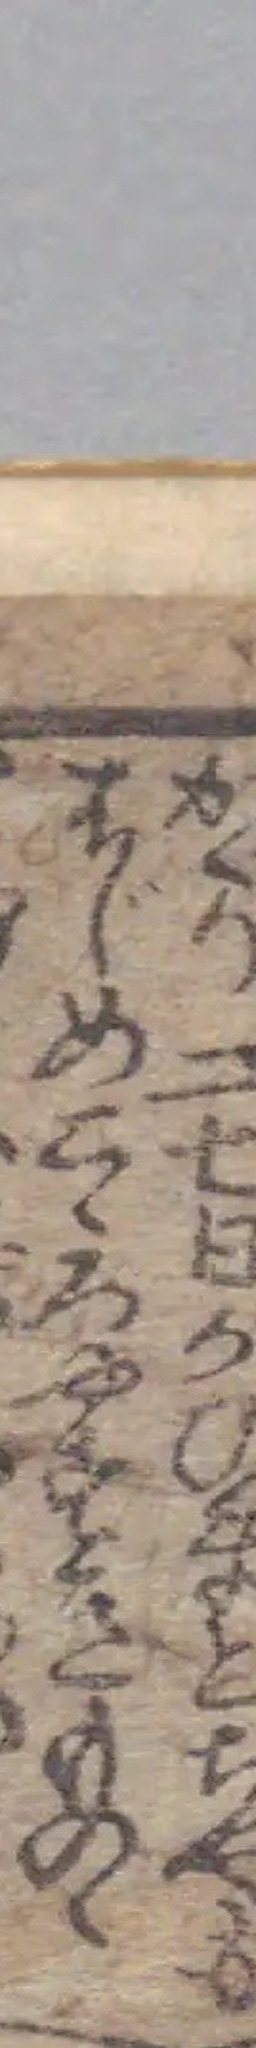はじめこゝろやすきものゝ
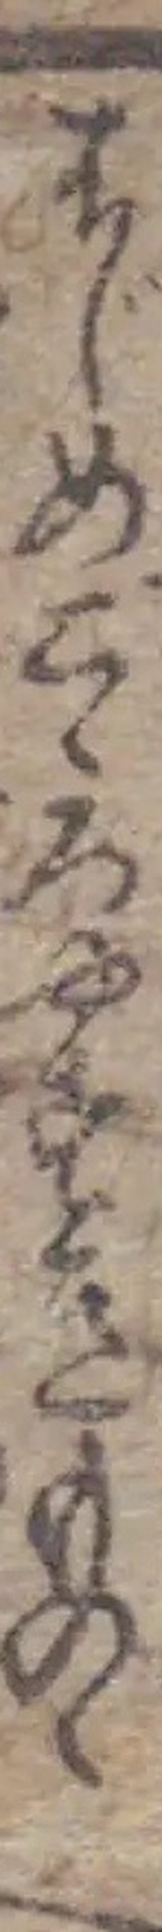はじめこゝろやすきものゝ
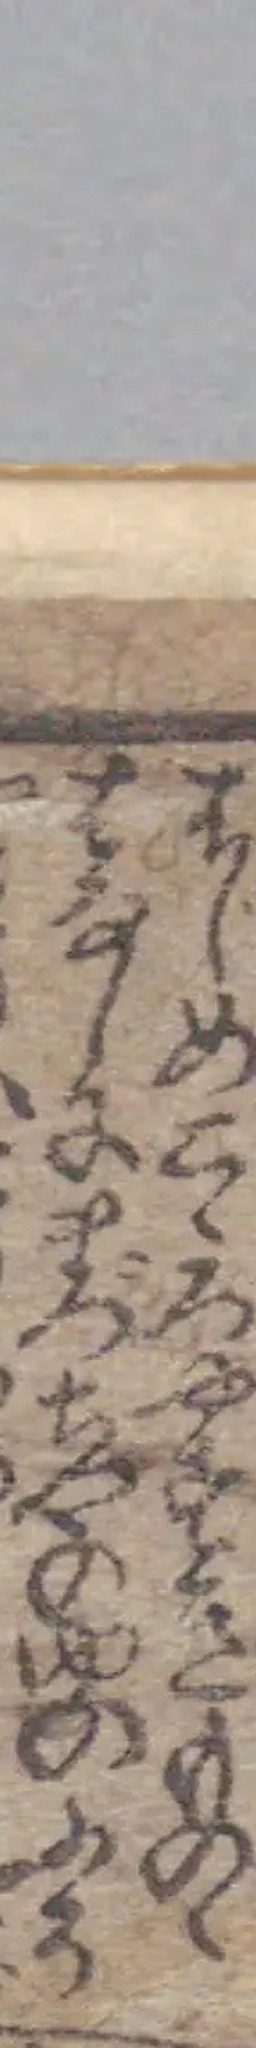はなしにまづちやのゆのふう
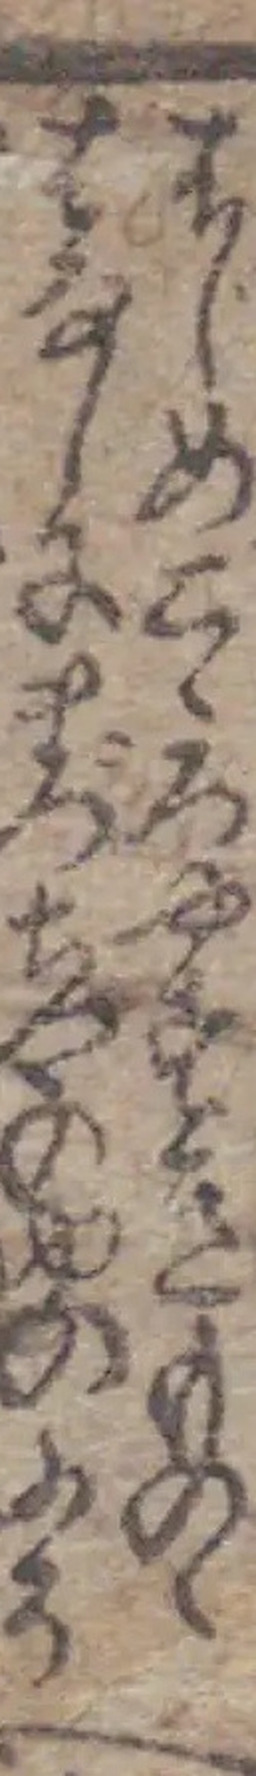はなしにまづちやのゆのふう
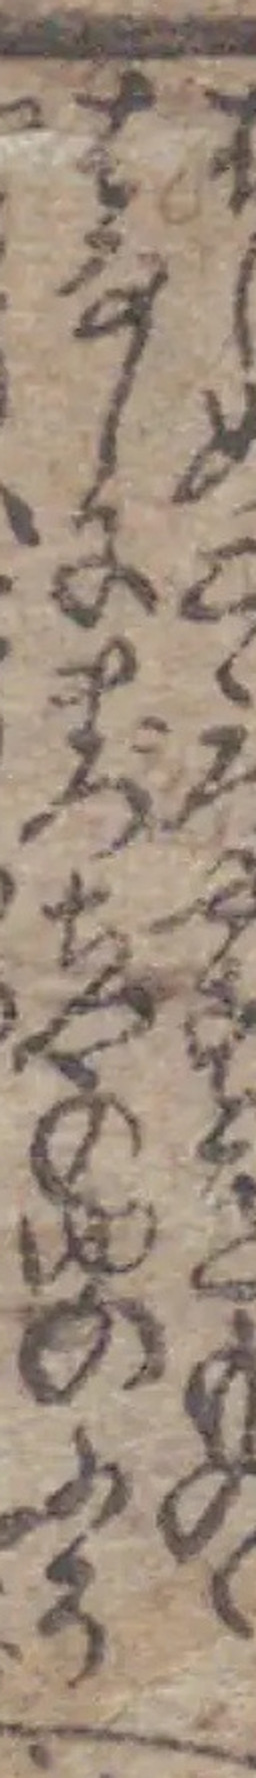はなしにまづちやのゆのふう
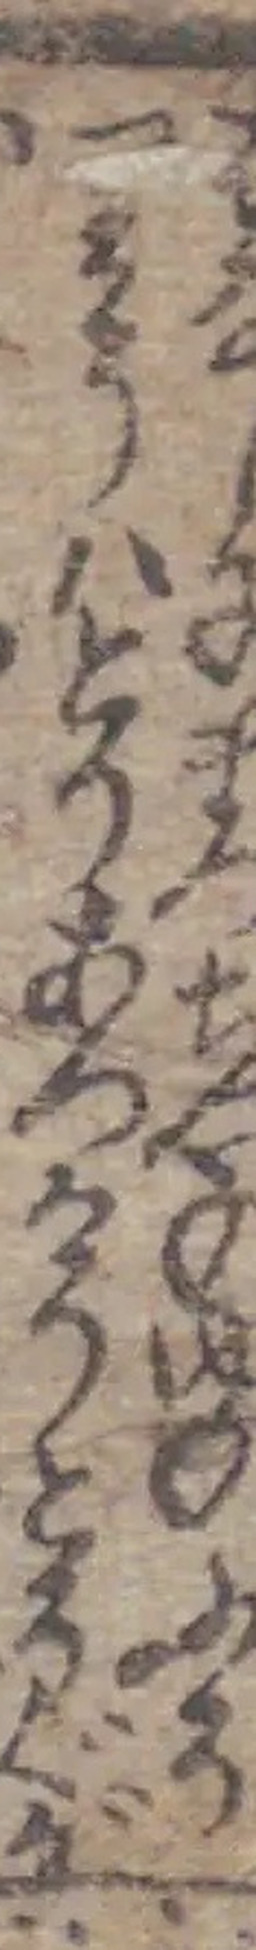りうはとりあつかうとかぐが
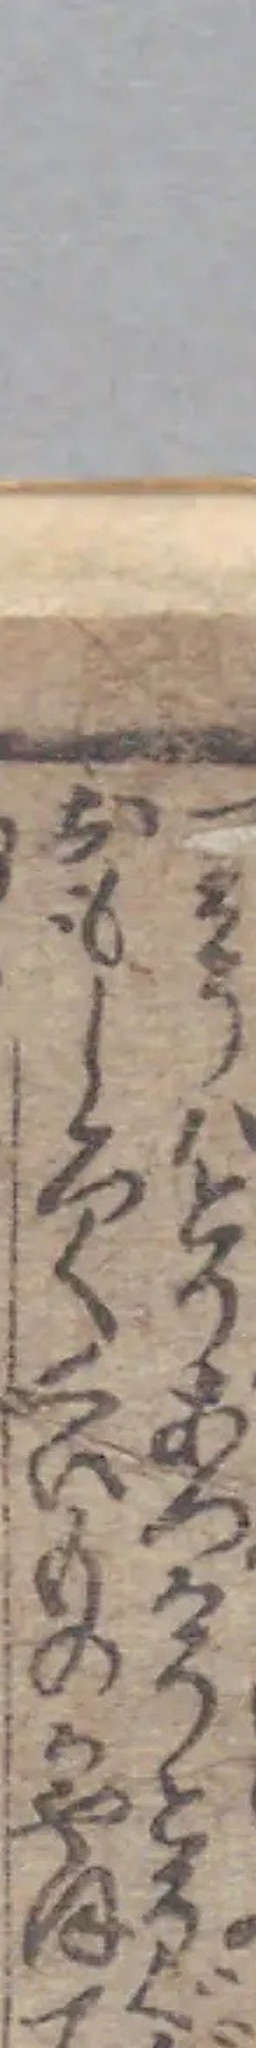おもしろくくいものかやほて
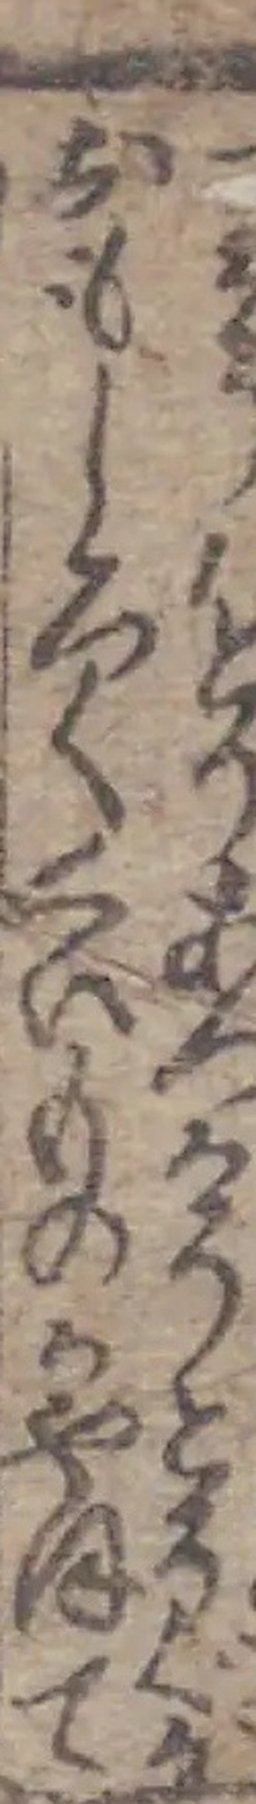おもしろくくいものかやほて
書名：津以曽無弟の甚六 3巻
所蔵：国立国会図書館 National Diet Library, JAPAN
